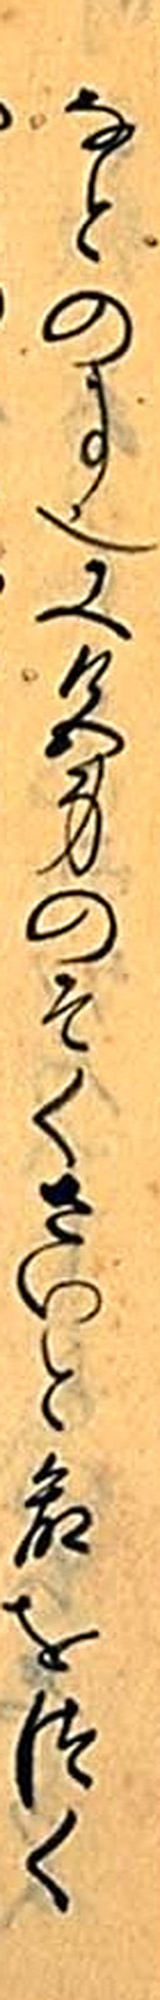なとの事也又色身のそくさいと命をつく
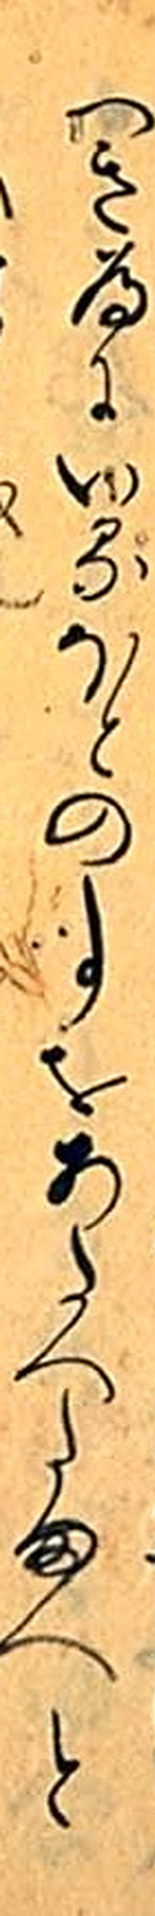へき為にいるほとの事をあたへたまへと
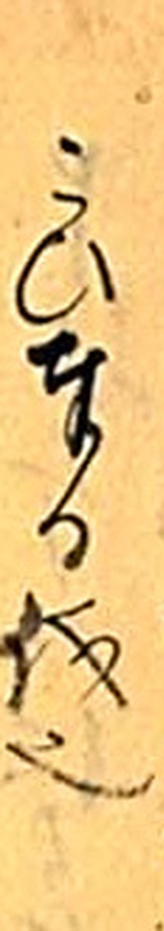こひ奉る儀也
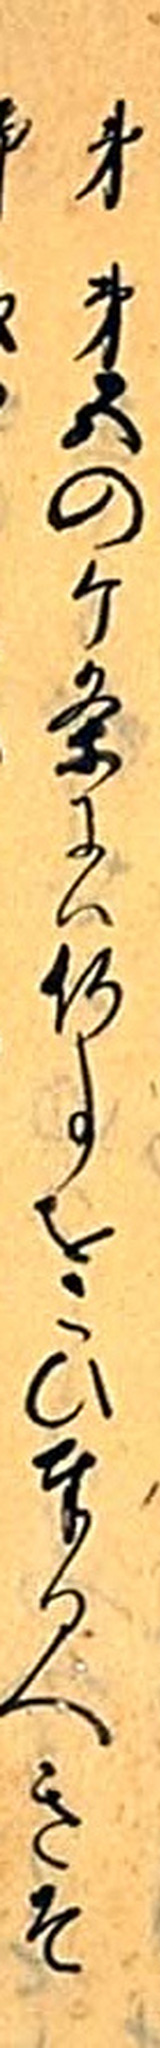弟第五のケ条には何事をこひ奉るへきそ
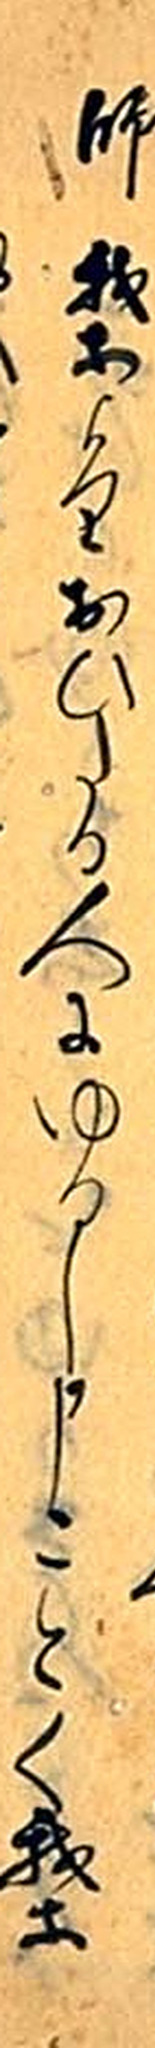師我等よりおひたる人にゆるし申ことく我等
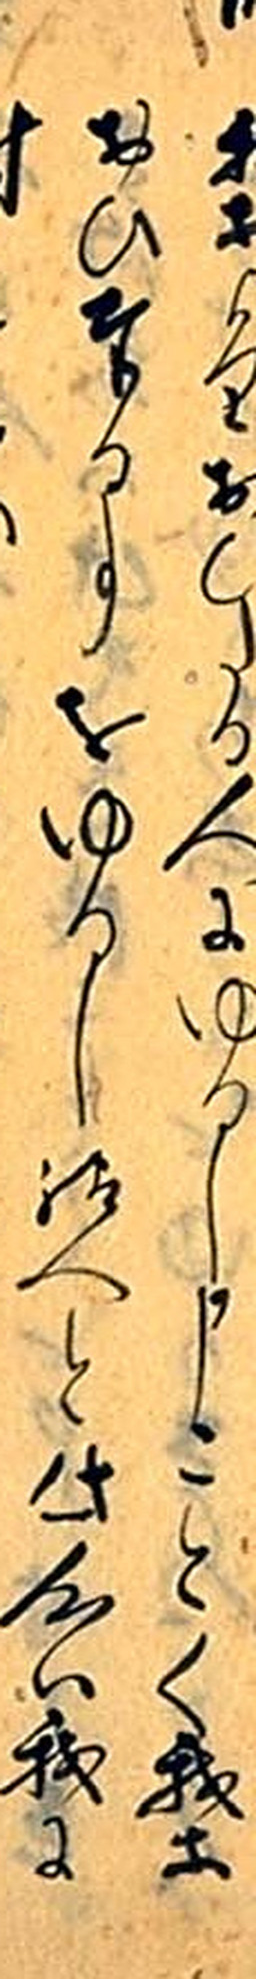おひ奉る事をゆるし給へと此心は我に
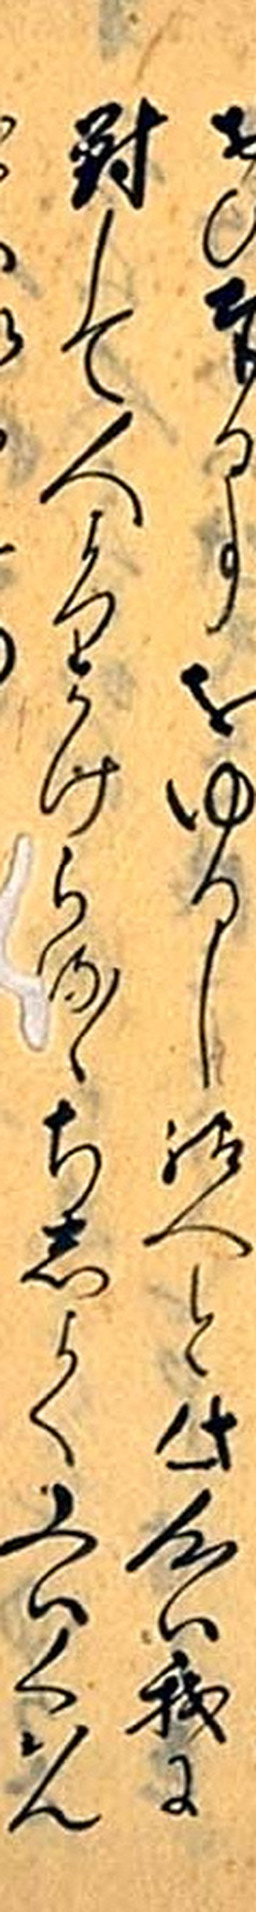対して人よりうけらるゝちしよく又はくはん
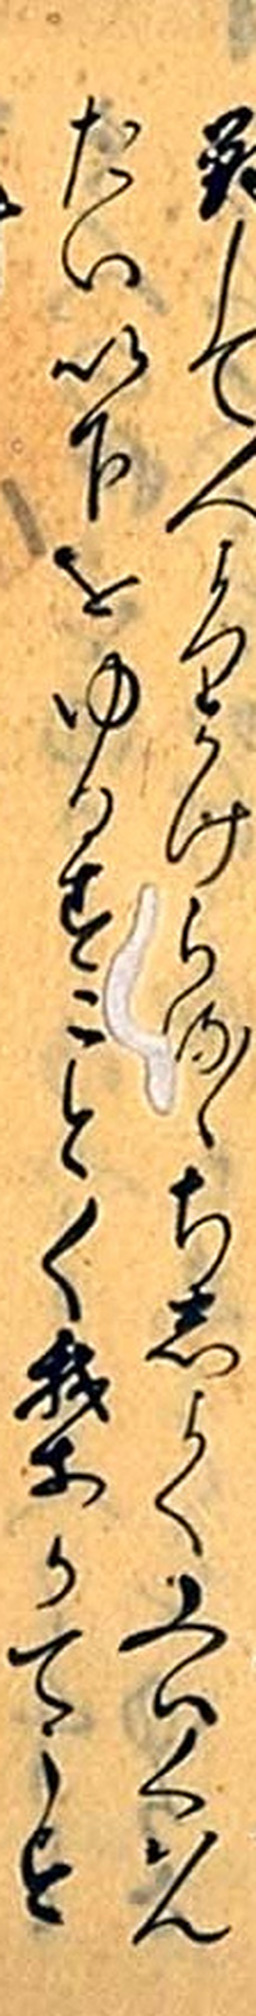たい以下をゆるすことく我等かてうす
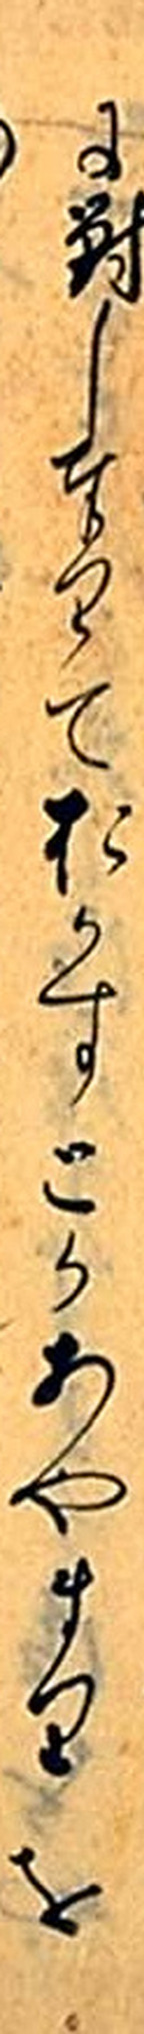に対し奉りておかすとかあやまりを
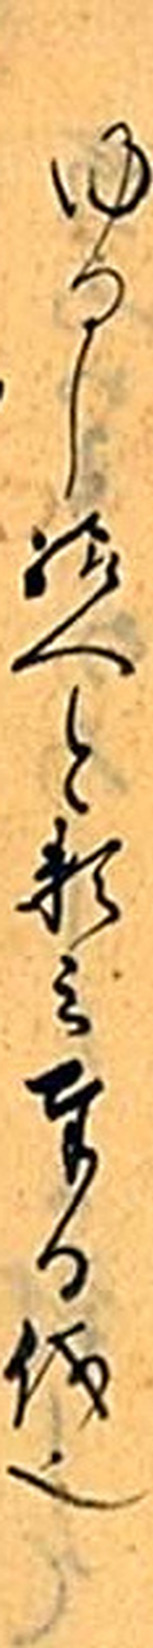ゆるし給へと頼み奉る儀也
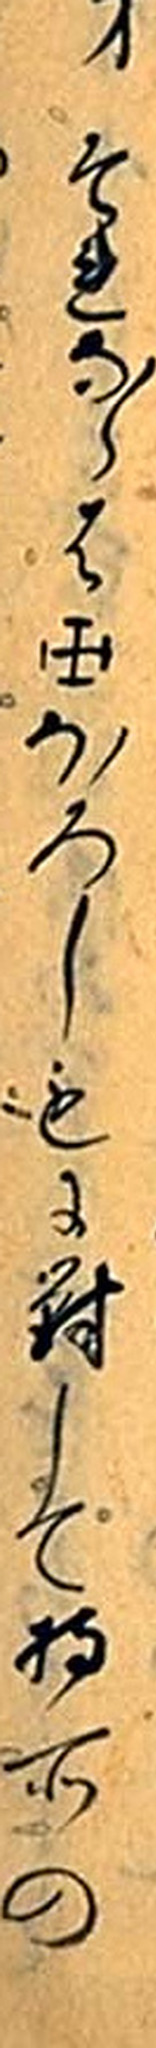弟それならは☩ほろしもに対して持所の
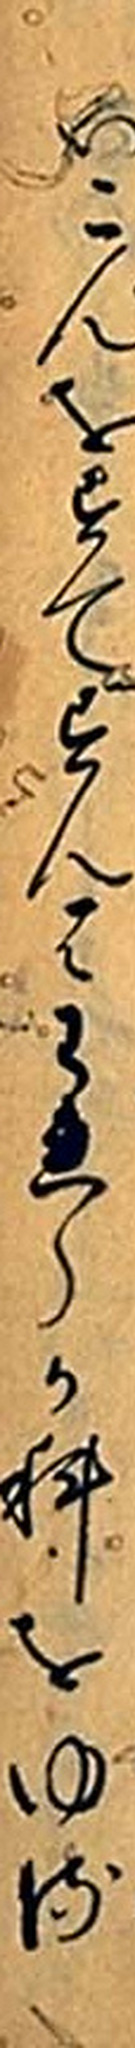いこんをすてすんはわれらか科をゆる

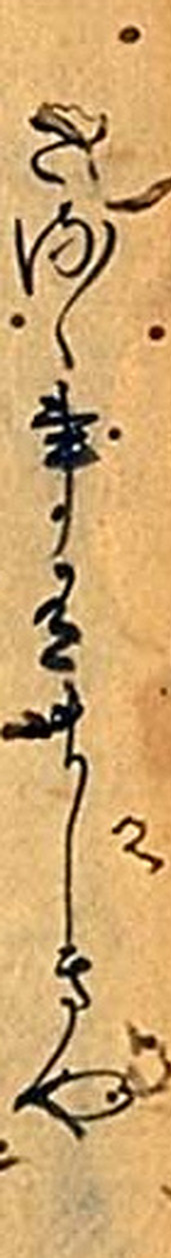さるゝ事有ましきや
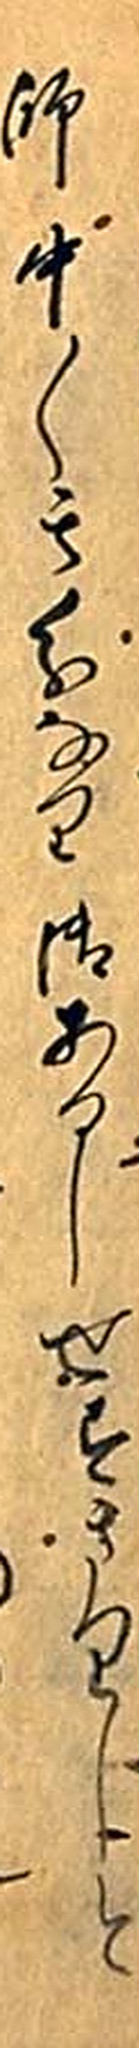師中〳〵其分なり御あるしせすきりしと
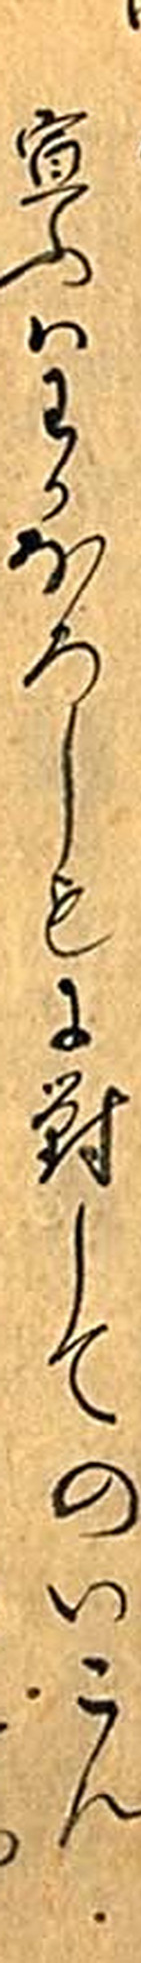宣ふはわかほろしもに対してのいこん
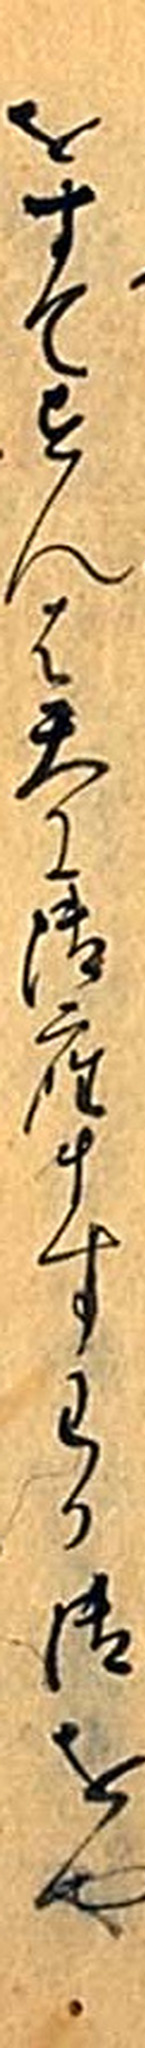をすてすんは天に御座ますわか御をや
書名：ドチリナ・キリシタン
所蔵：東京大学総合図書館 / General Library in the University of Tokyo
